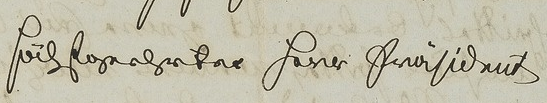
höchstgeehrter Herr Präsident
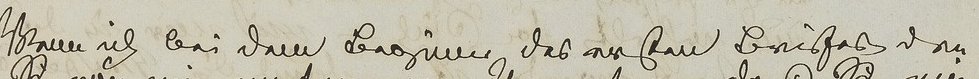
Wenn ich bei dem Beginne des ersten Briefes, den
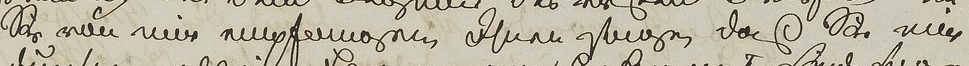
Sie von mir empfangen, Ihnen sage, daß Sie mir
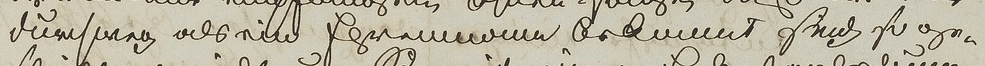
durchweg als ein Ehrenmann bekannt sind, so ge-
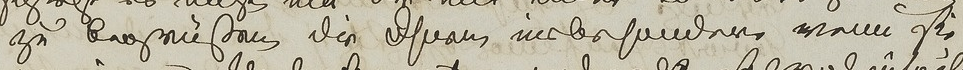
zu begrüßen, die Ihnen, insbesondere wenn sie
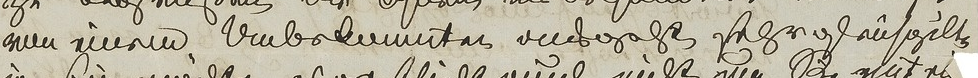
von einem Unbekannten ausgeht, sehr gleichgilt-
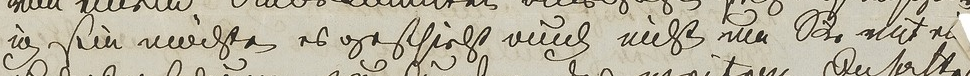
ig sein möchte, es geschieht auch nicht, um Sie mit einer
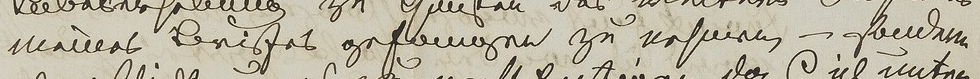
meines Briefes gefangen zu nehmen, – sondern
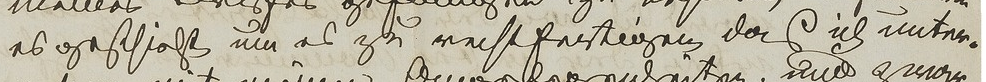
es geschieht, um es zu rechtfertigen, daß ich unter-
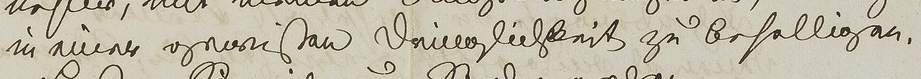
in einer gewißen Dringlichkeit, zu behelligen.
